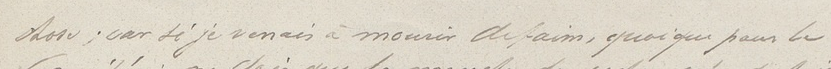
chose; car si je venais à mourir de faim, quoique pour le
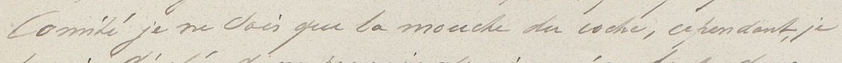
Comité je ne sois que la mouche du coche, cependant, je
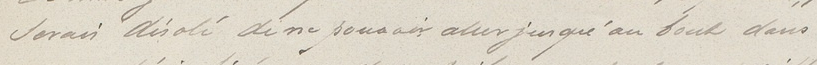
serais désolé de ne pouvoir aller jusqu'au bout dans
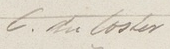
C. du Coster
